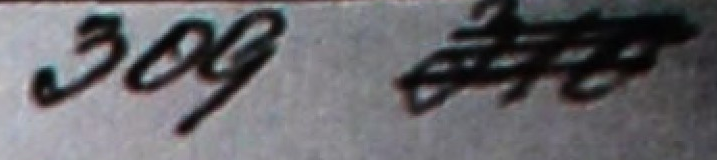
309 310
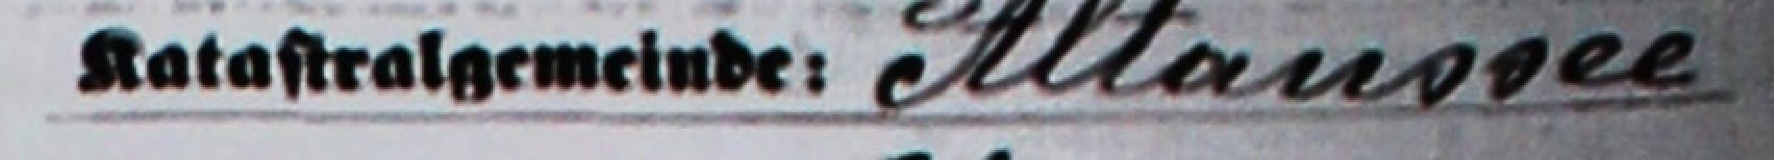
Katastralgemeinde: Altaussee
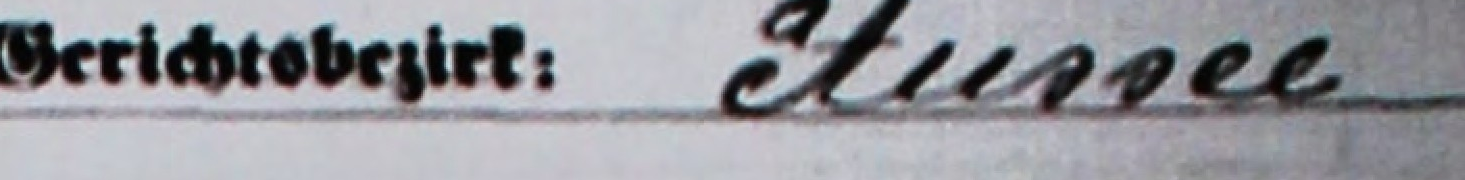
Gerichtsbezirk: Aussee
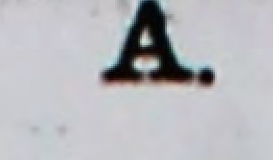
A.
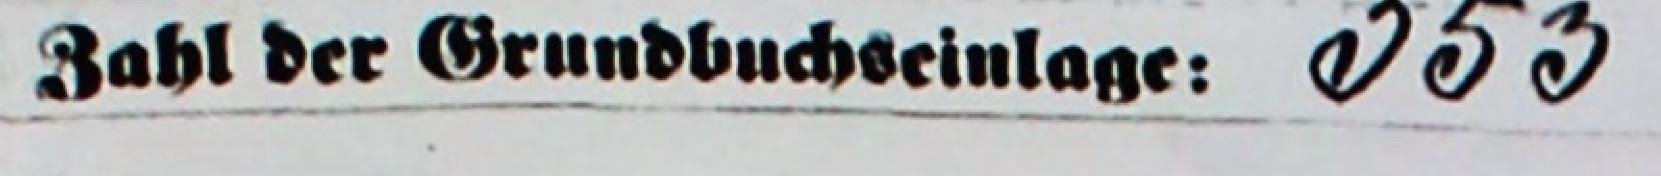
Zahl der Grundbuchseinlage: 353
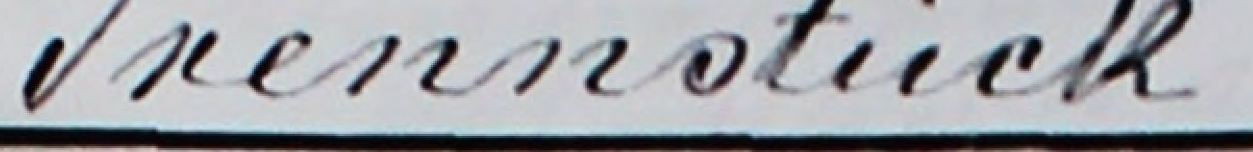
Trennstück
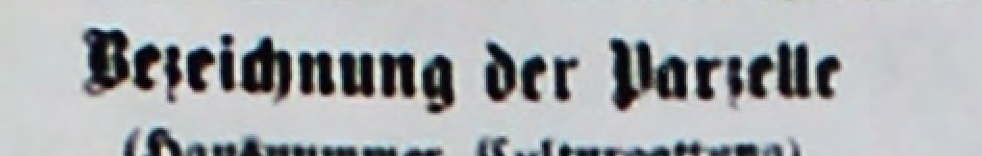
Bezeichnung der Parzelle
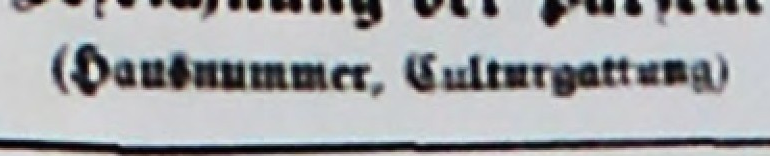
(Hausnummer, Culturgattung)
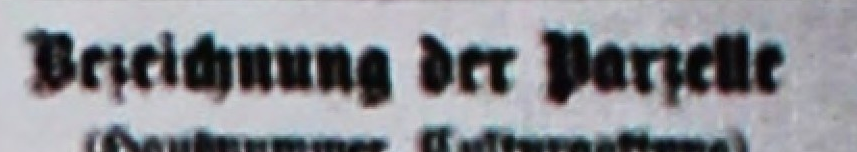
Bezeichnung der Parzelle
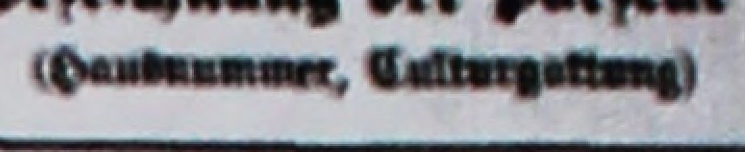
(Hausnummer, Culturgattung)
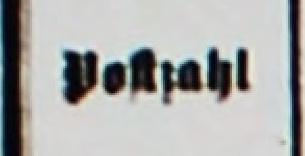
Postzahl
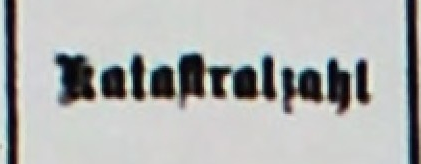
Katastralzahl
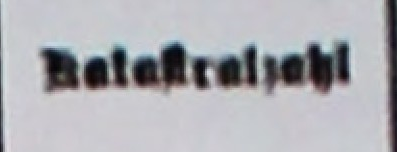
Katastralzahl
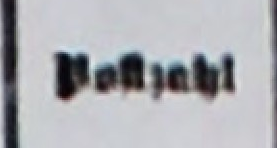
Postzahl
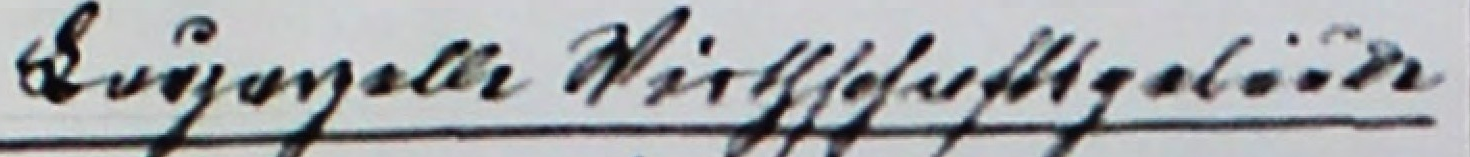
Bauparzelle Wirthschaftsgebäude
